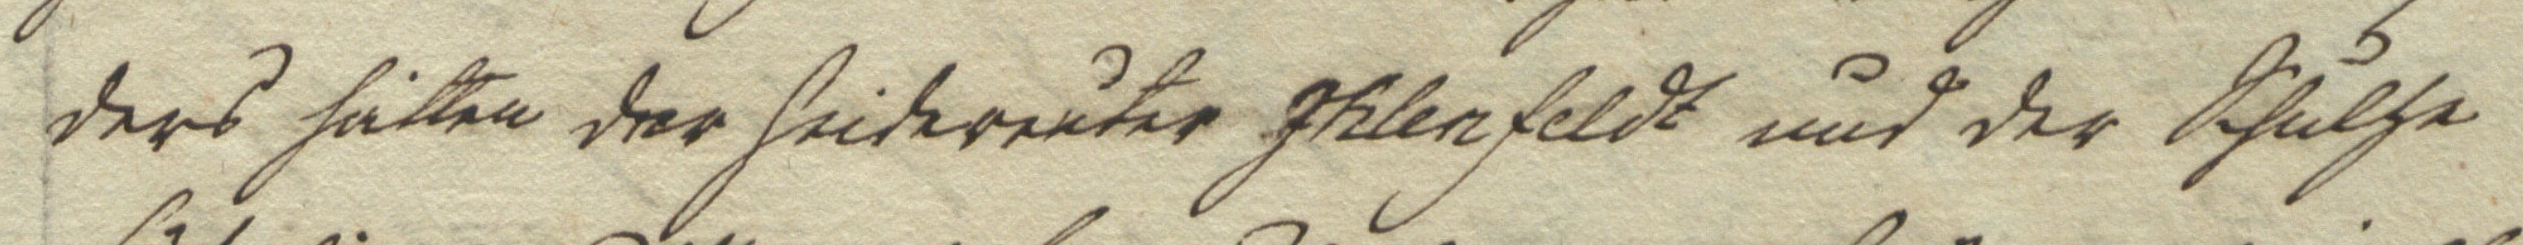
ders hätten der Heidereuter Ihlenfeldt und der Schulze
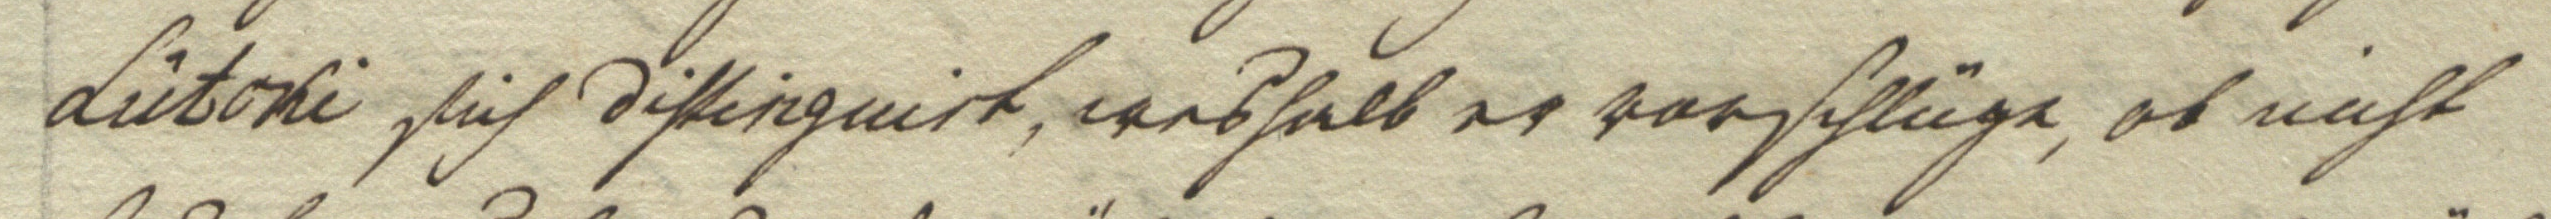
Lütcke sich distinguirt, weshalb er vorschlüge, ob nicht
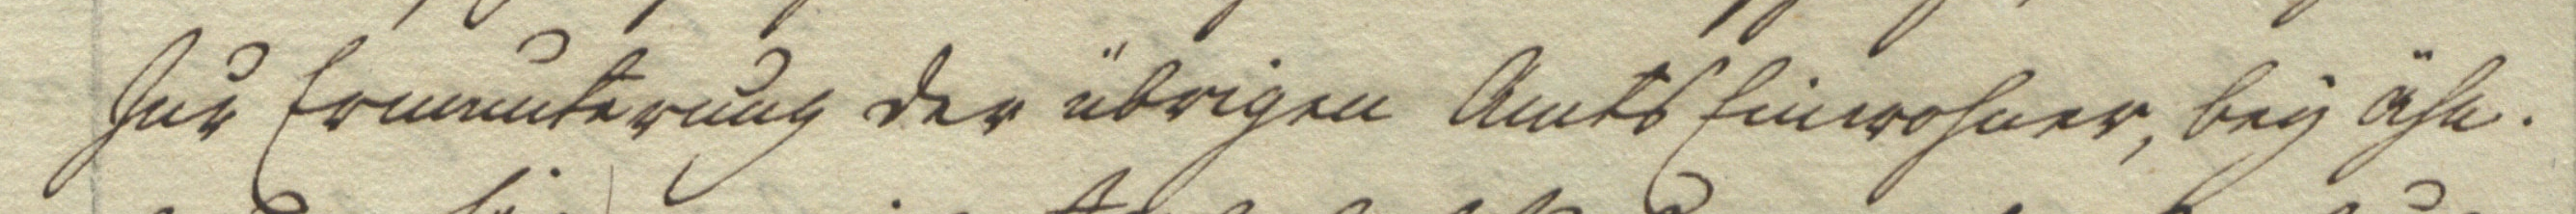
zur Ermunterung der übrigen Amts Einwohner, bey ähn-
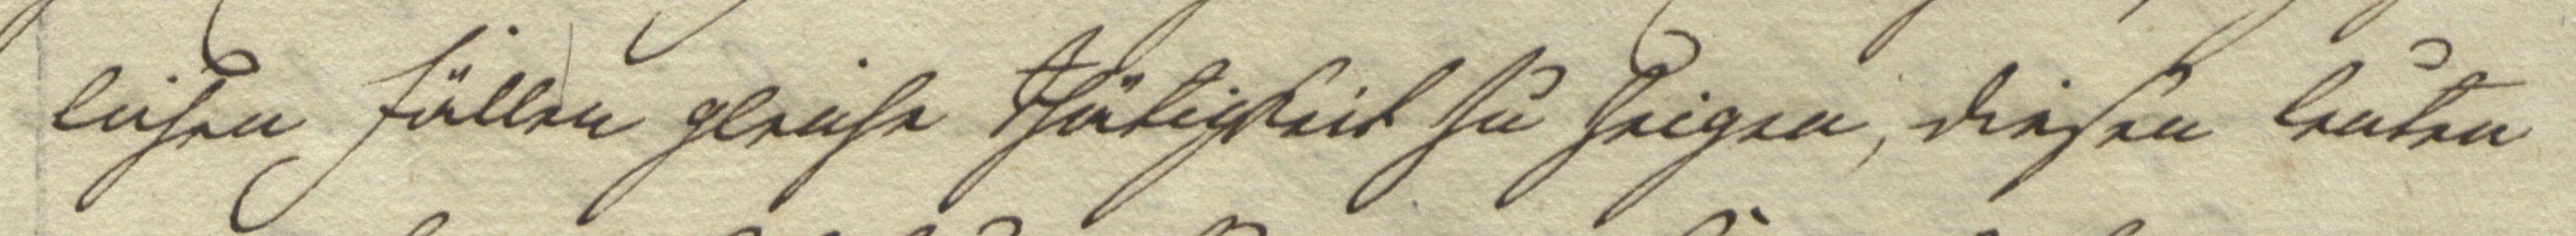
lichen Fällen gleiche Thätigkeit zu zeigen, diesen leuten
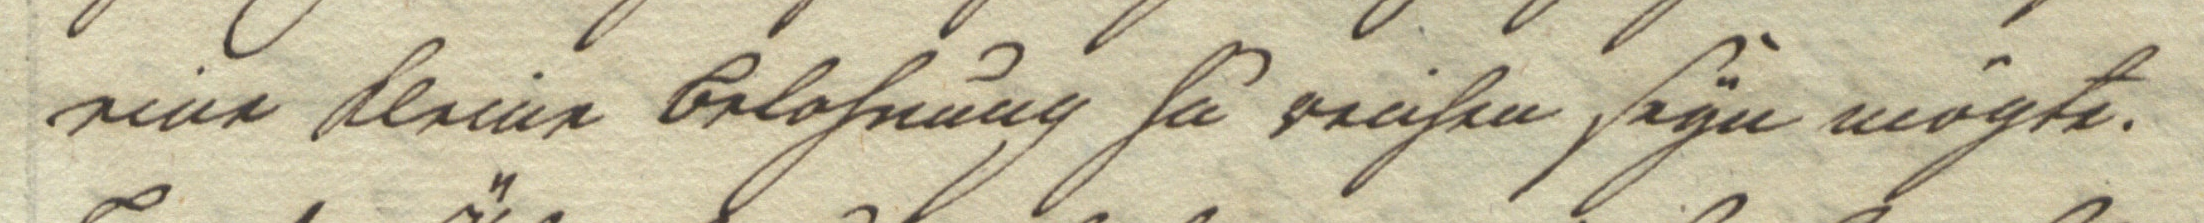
eine kleine Belohnung zu reichen seyn mögte.
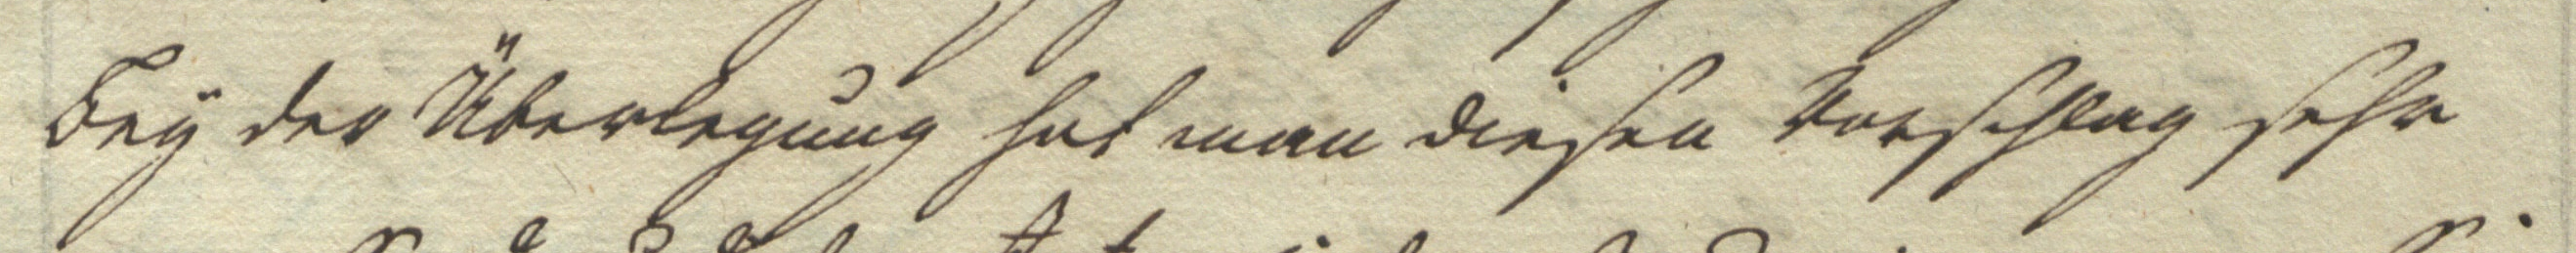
Bey der Überlegung hat man diesen Vorschlag sehr
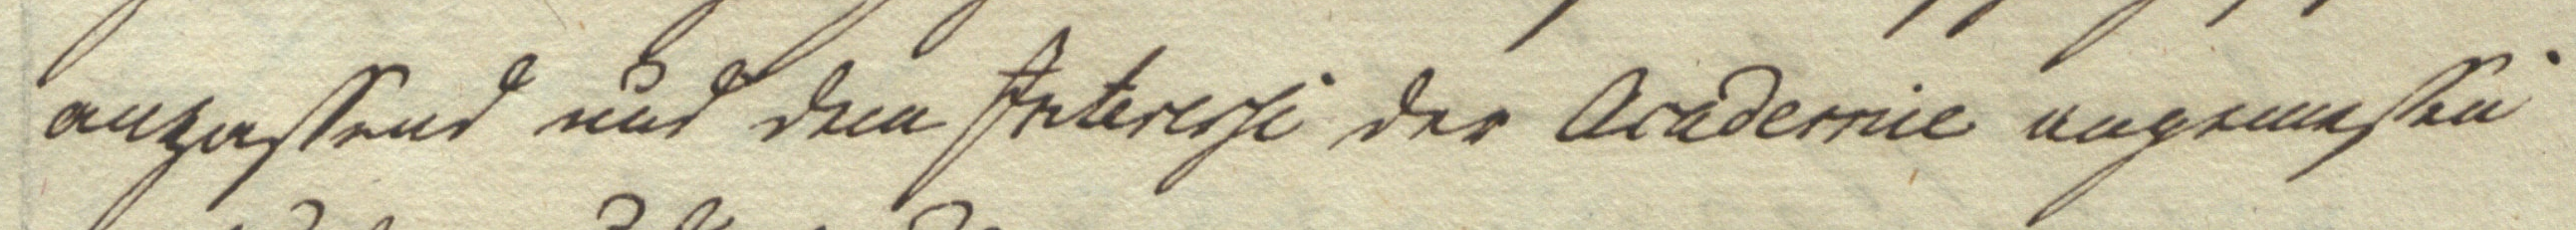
anpassend und den Interessi der Academie angemessen
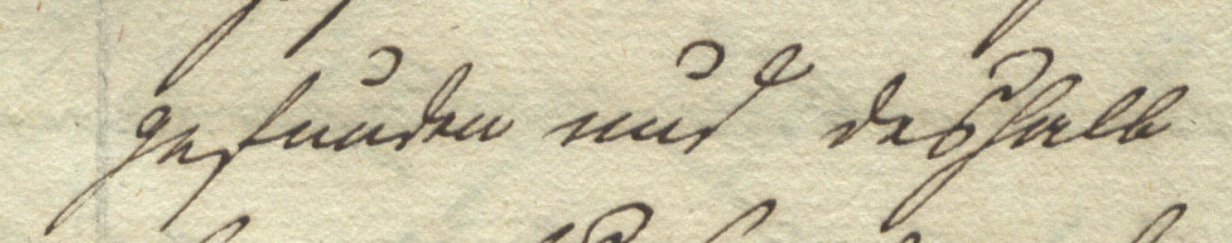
gefunden und deshalb
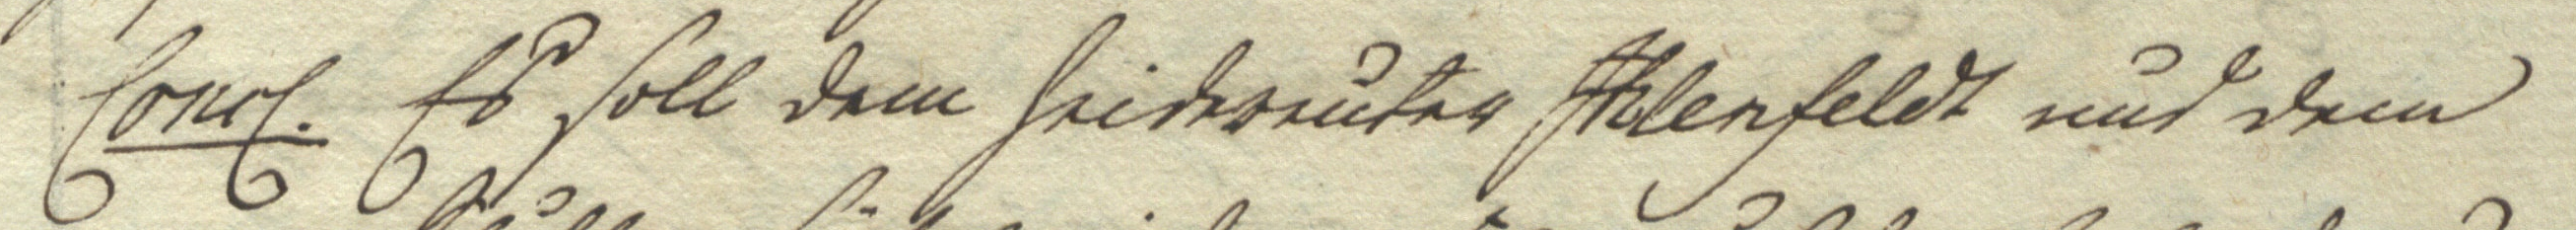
Concl. Es soll dem Heidereuter Ihlenfeldt und dem
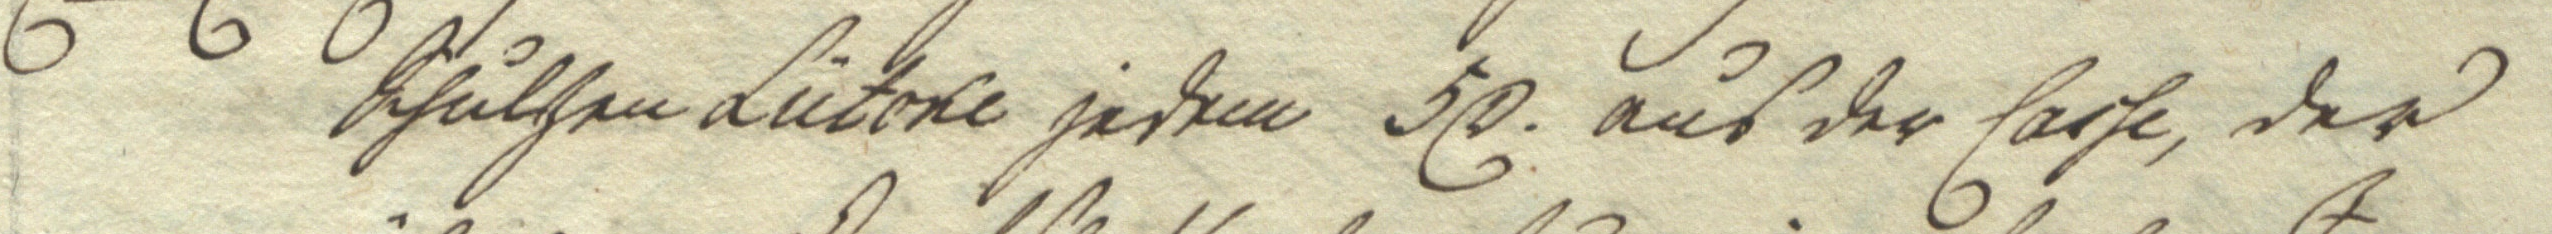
Schulzen Lütcke jedem 5 rtl. aus der Casse, der
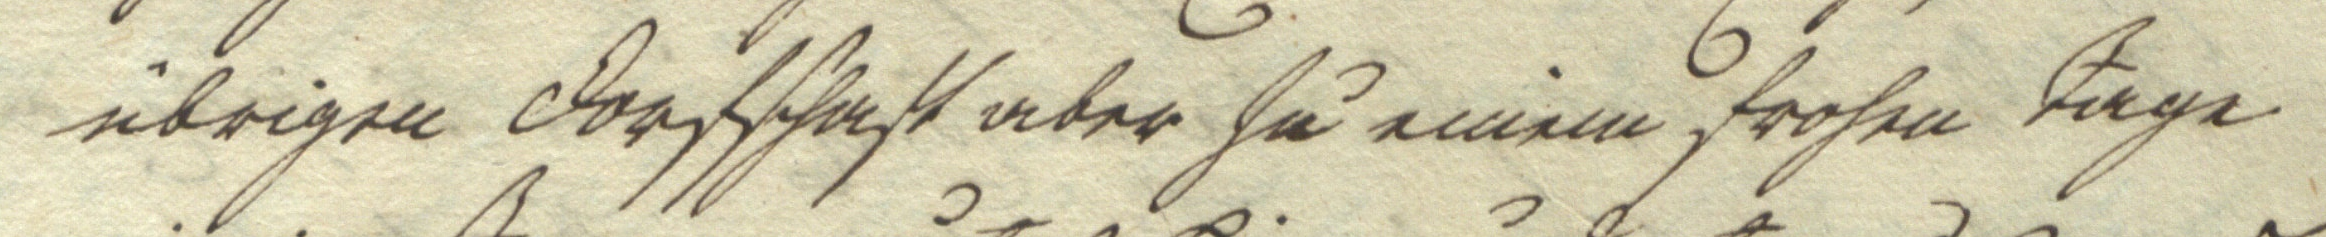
übrigen Dorfschaft aber zu einem frohen Tage
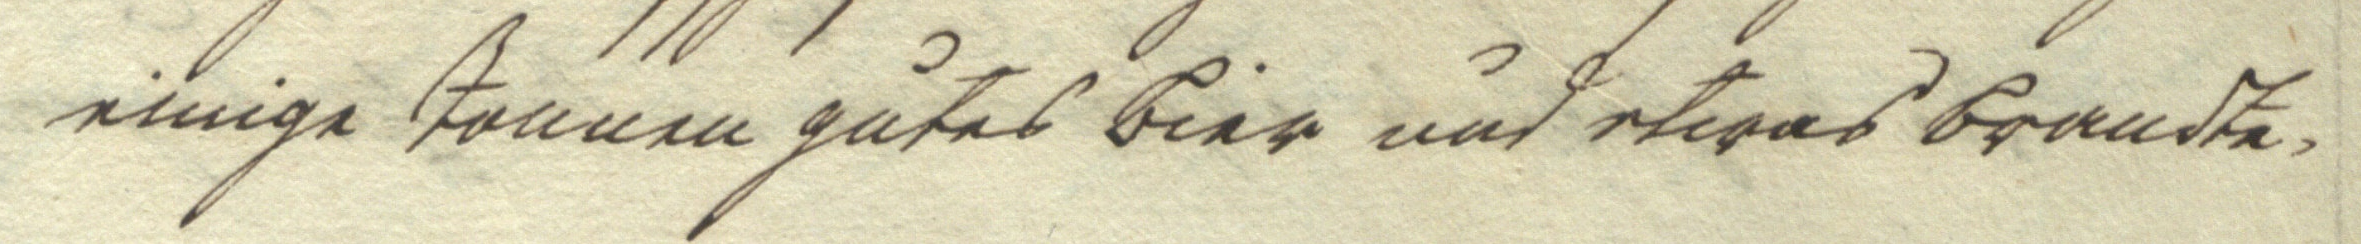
einige Tonnen gutes Bier und etwas Brandte¬
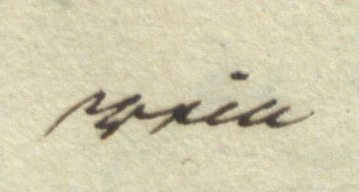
wein
